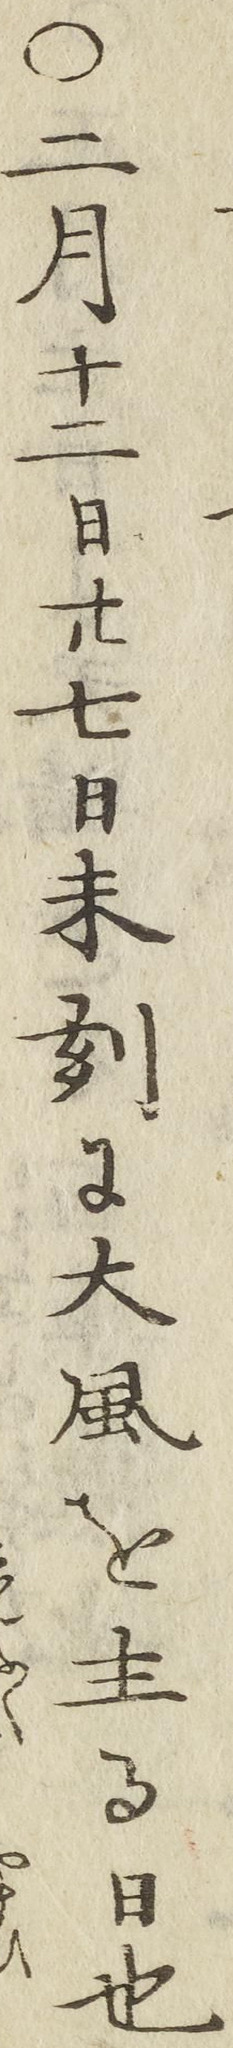○二月十二日廿七日未刻に大風を主る日也
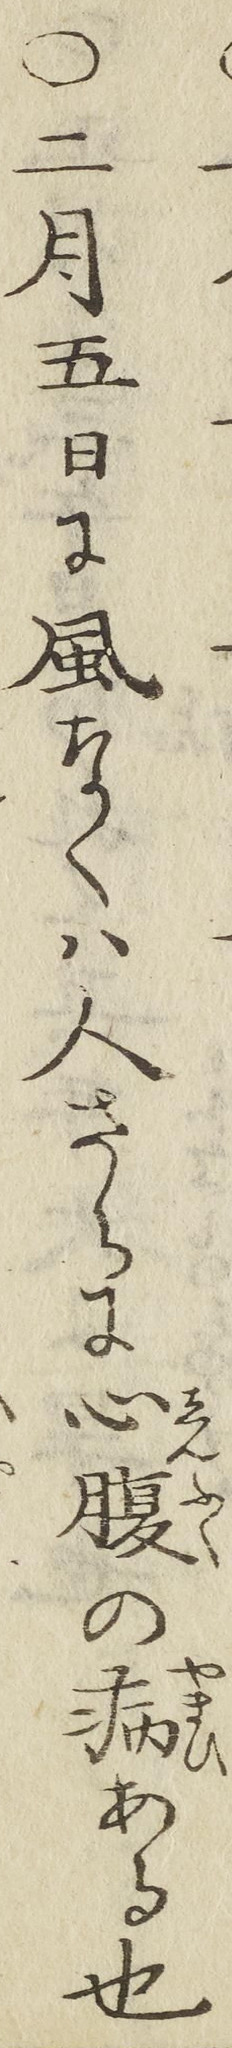○二月五日に風なくは人さらに心腹の病ある也
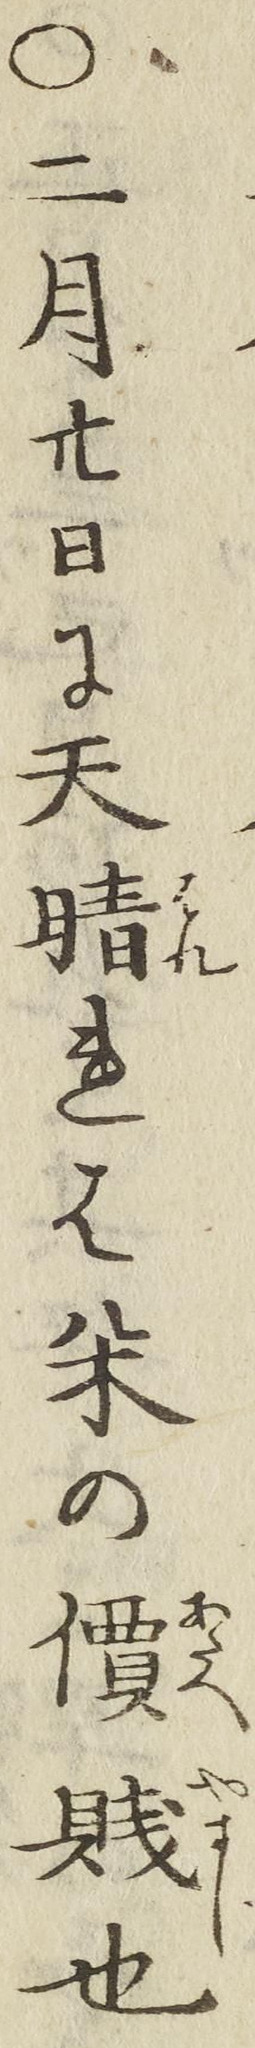○二月廿日に天晴れは米の価賤也
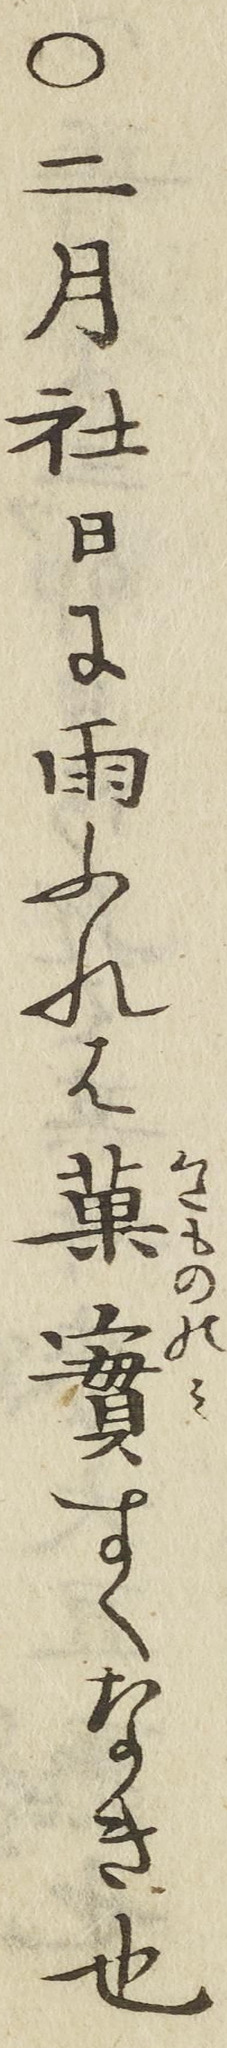○二月社日に雨ふれは菓実すくなき也
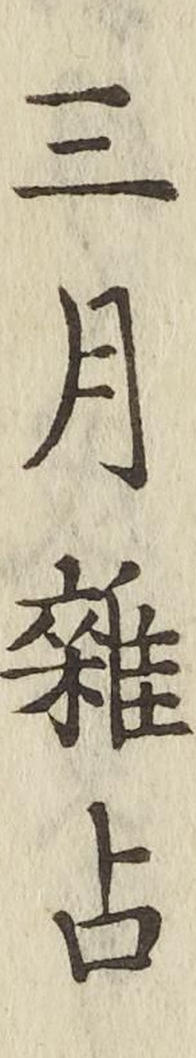三月雑占
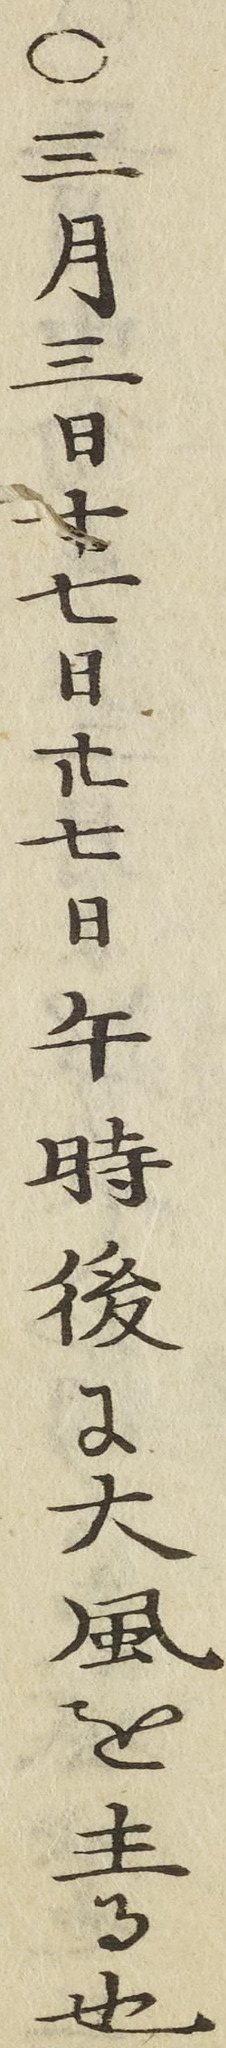○三月三日十七日廿七日午時後に大風を主る也
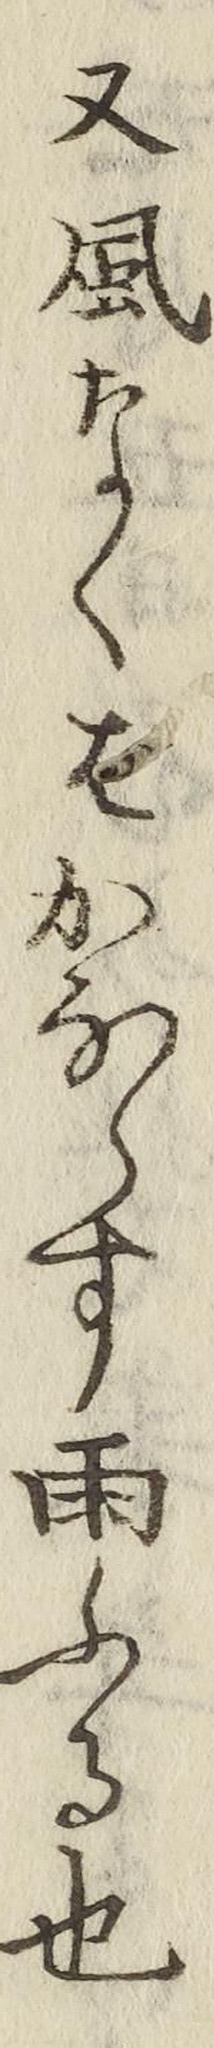又かぜなくはかならす雨ふる也
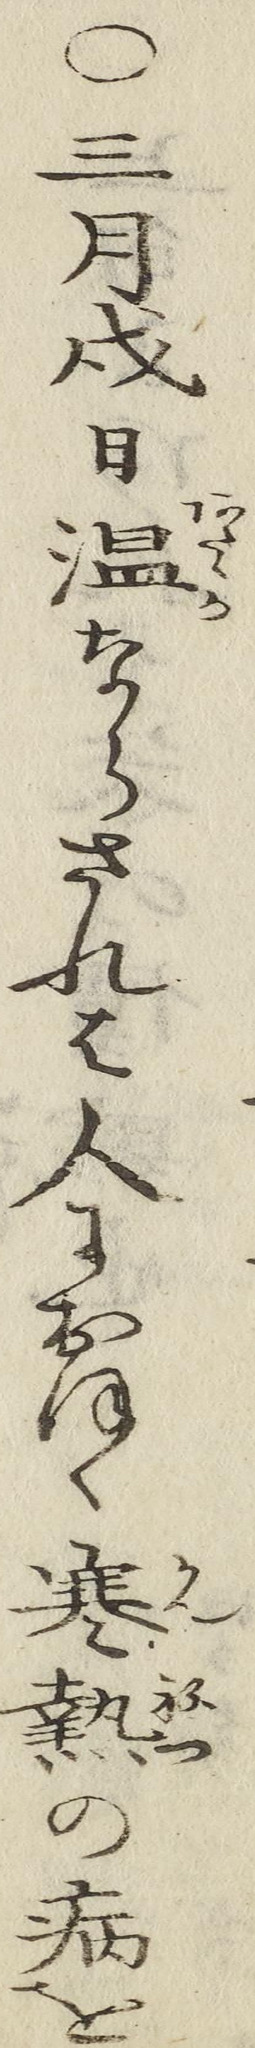○三月戌日温ならされは人におほく寒熱の病を
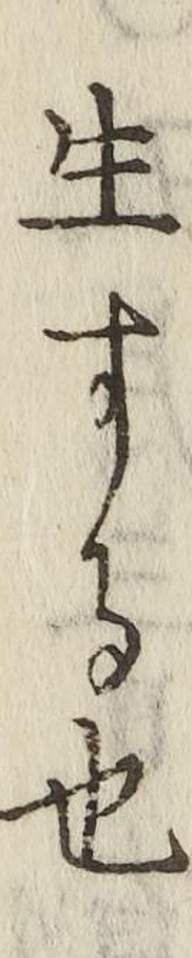生する也
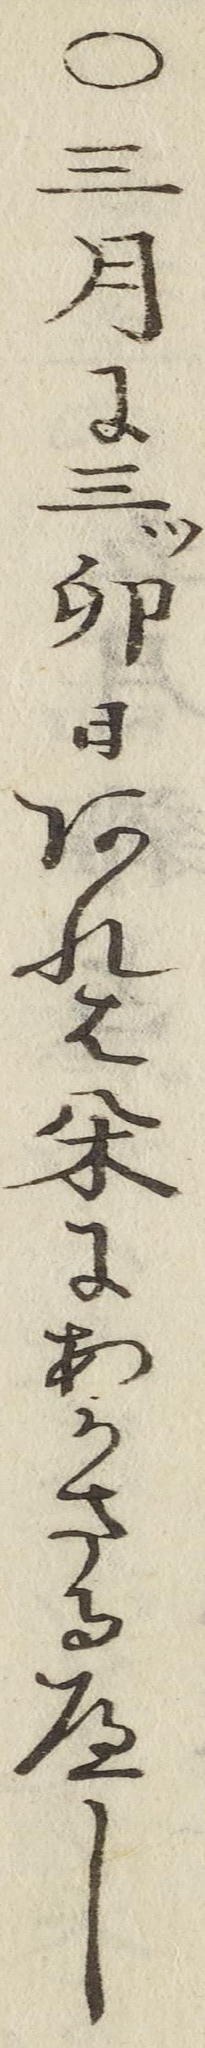○三月に三ッ卯日あれは米にあかさるへし
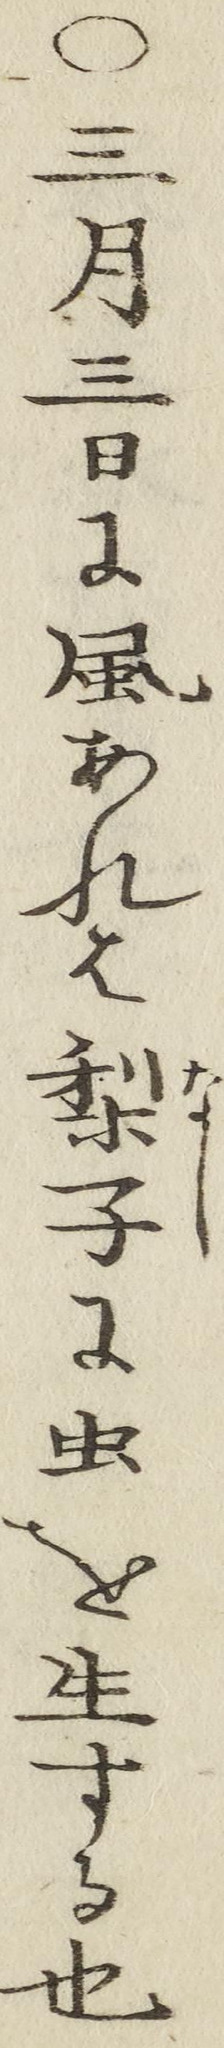○三月三日に風あれは梨子に虫を生する也
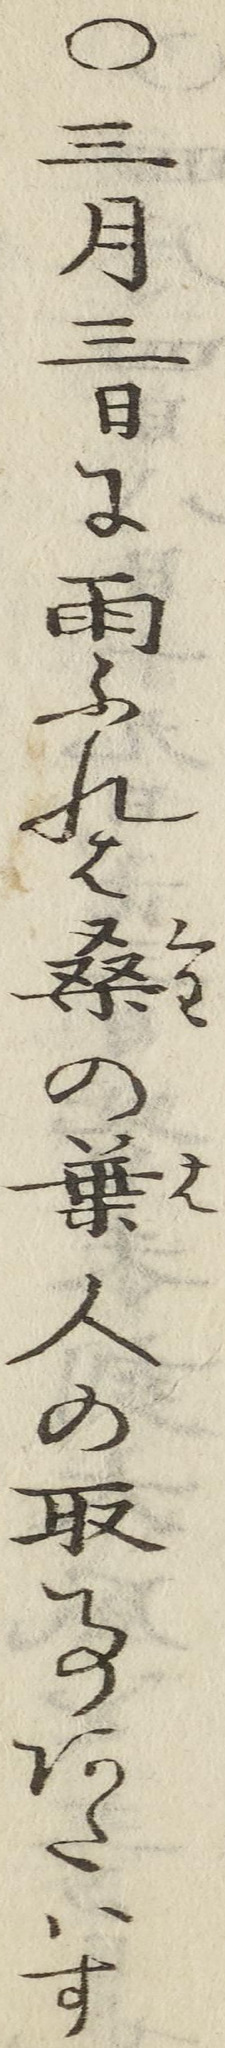○三月三日に雨ふれは桑の葉人の取事あたはす
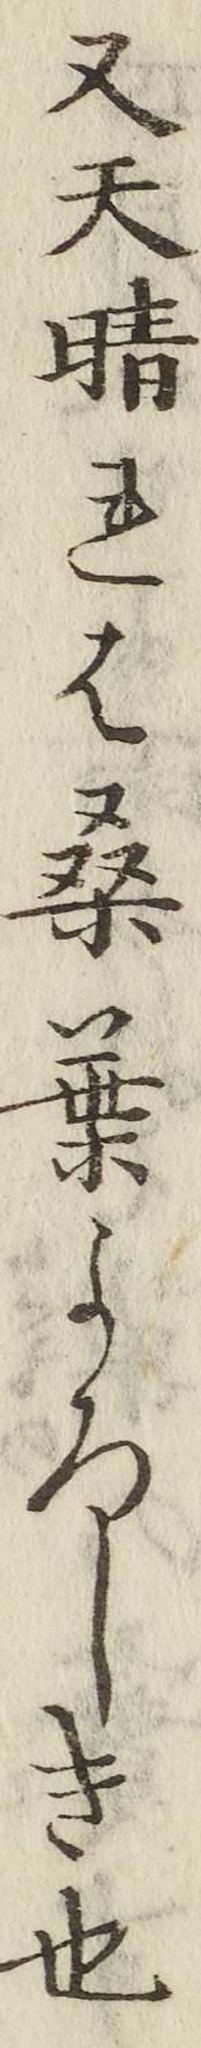又天晴れは桑葉よろしき也
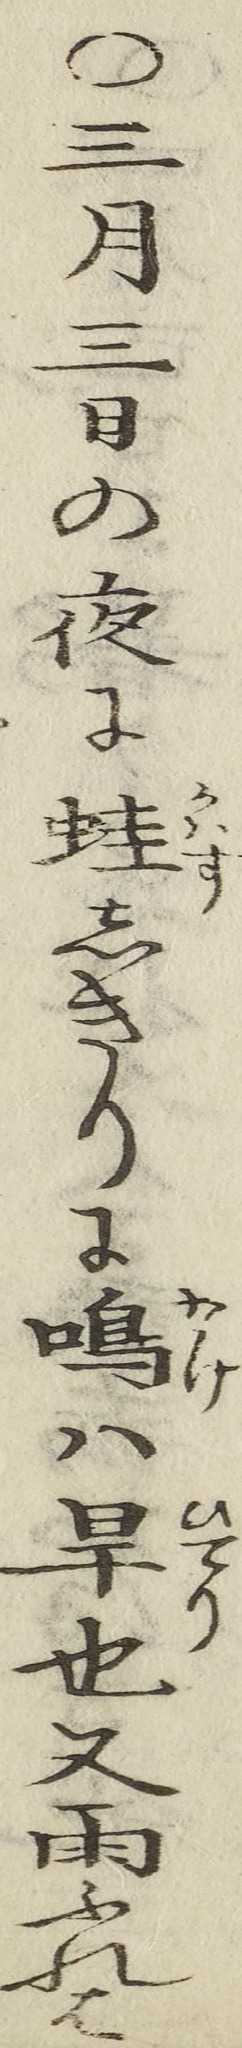○三月三日の夜に蛙しきりに鳴は旱也又雨ふれは
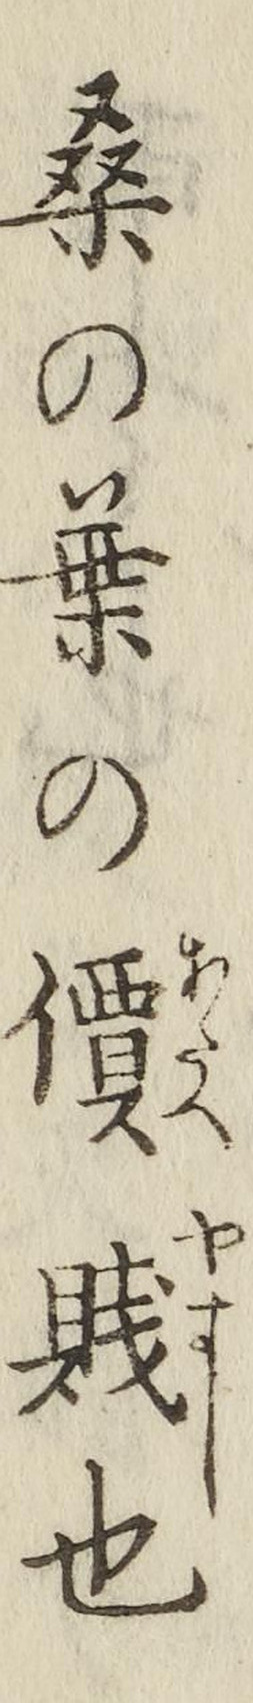桑の葉の価賤也
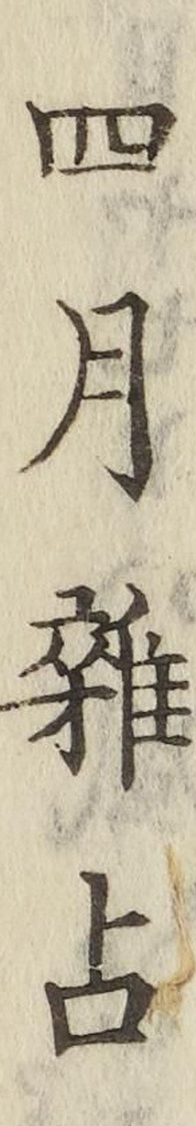四月雑占
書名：天時占候　二
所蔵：東京大学地震研究所図書室 Earthquake Research Institute Library, The University of Tokyo, JAPAN
